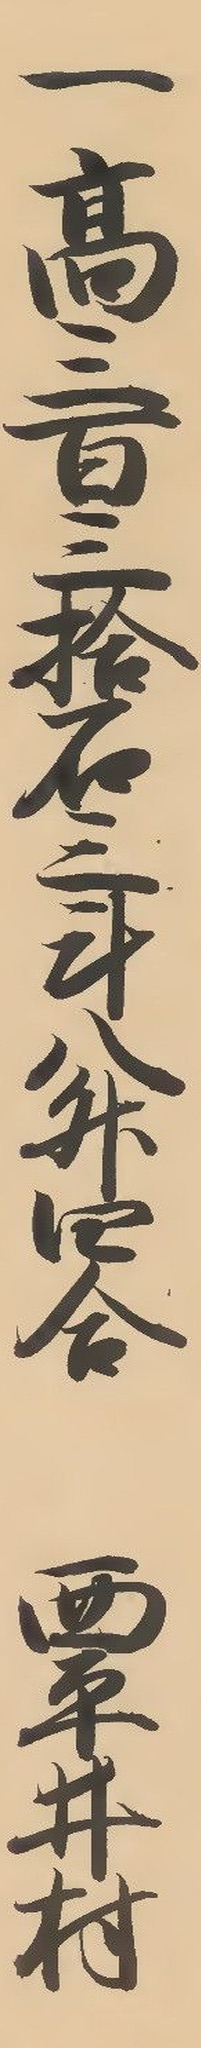一高三百三拾石三斗八升四合西平井村

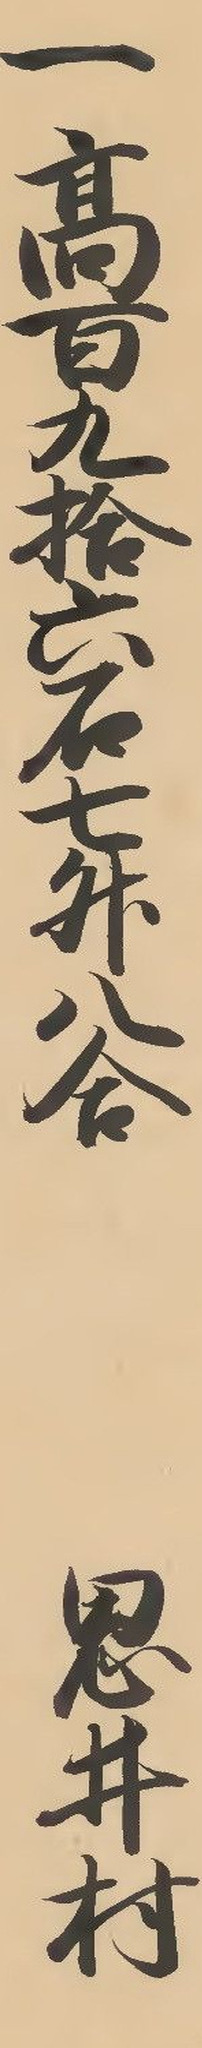一高百九拾六石七升八合思井村
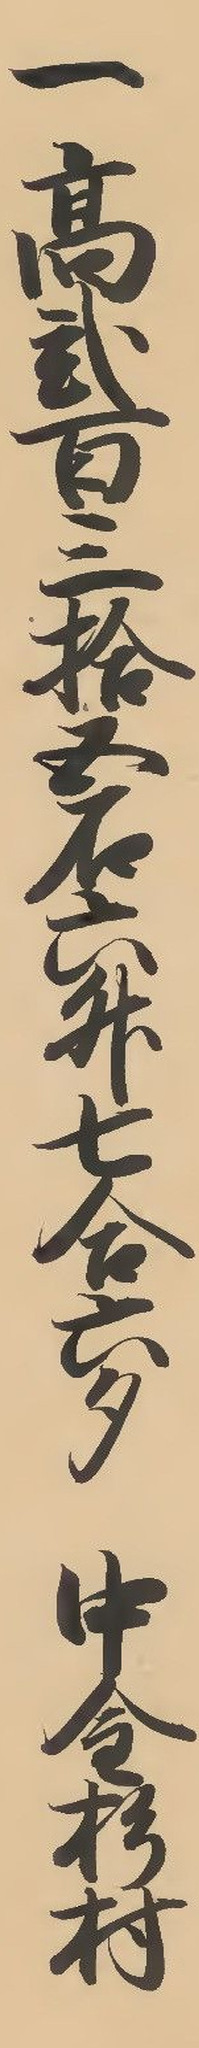一高弐百三拾五石六升七合六勺中金杉村
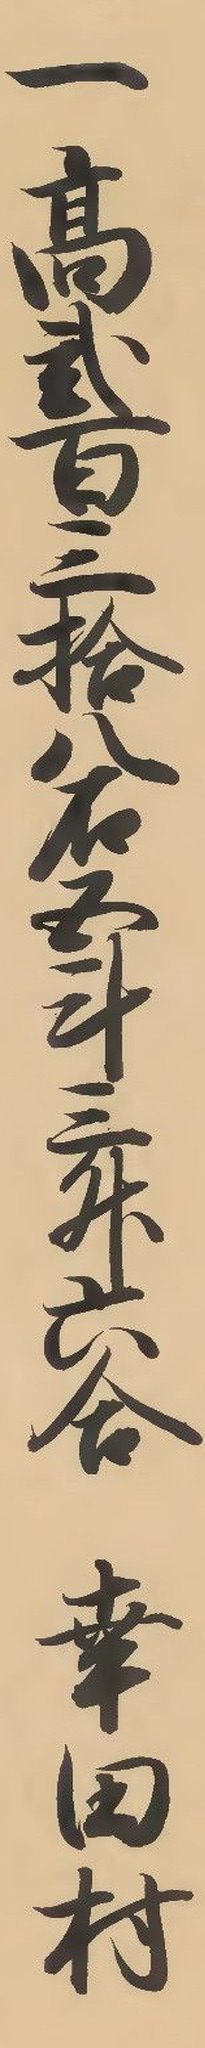一高弐百三拾八石五斗三升六合幸田村
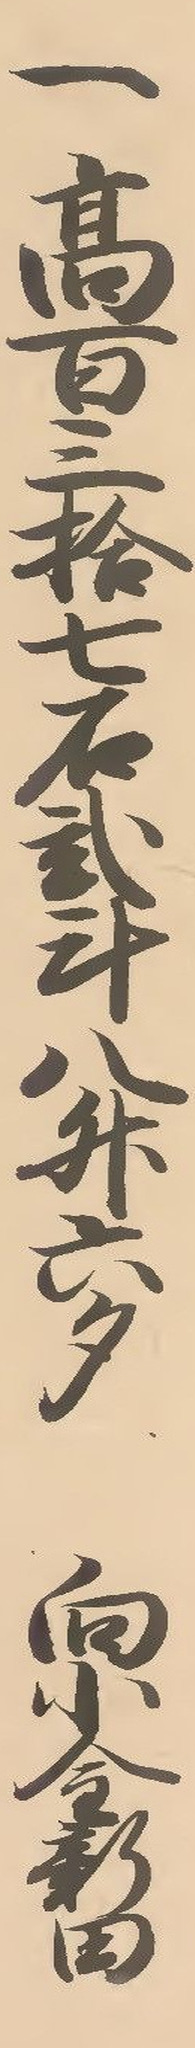一高百三拾七石弐斗八升六勺向小金新田
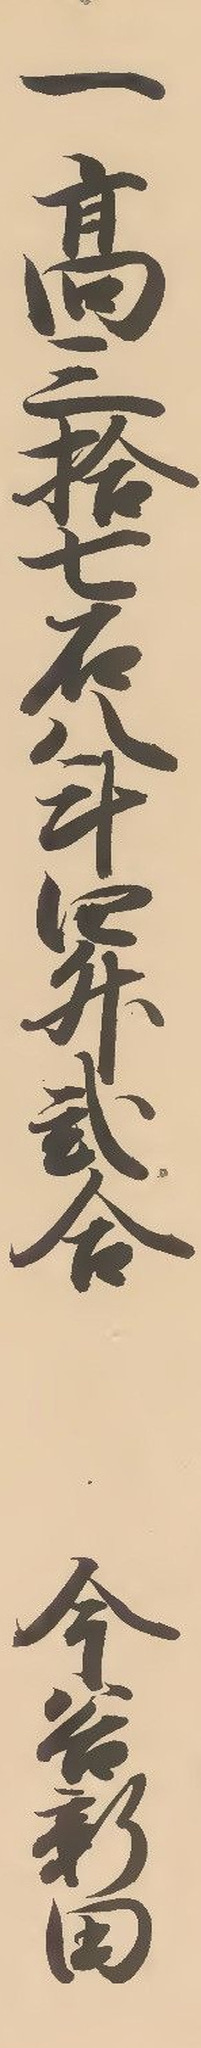一高三拾七石八斗四升弐合今谷新田
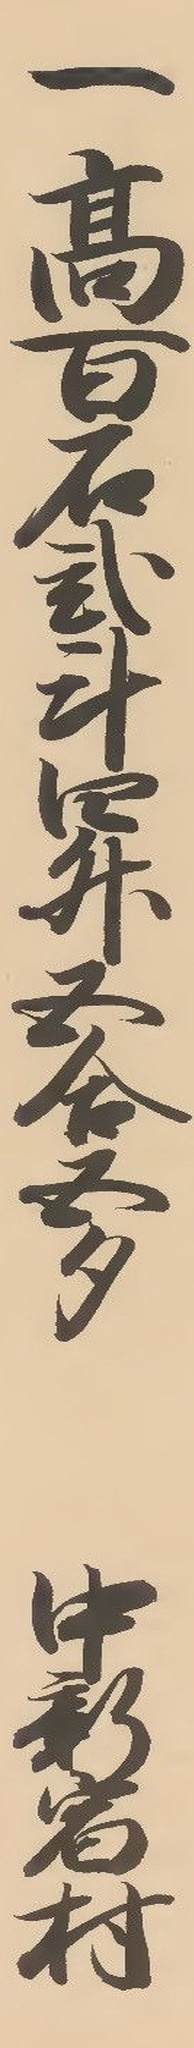一高百石弐斗四升五合五勺中新宿村
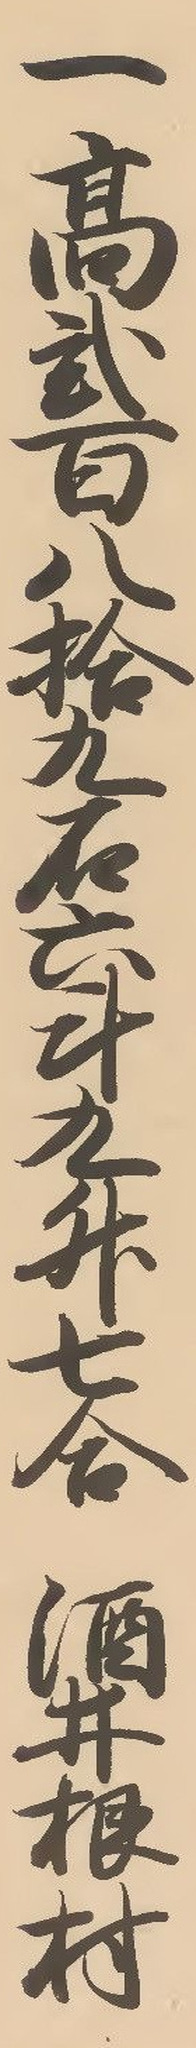一高弐百八拾九石六斗九升七合酒井根村

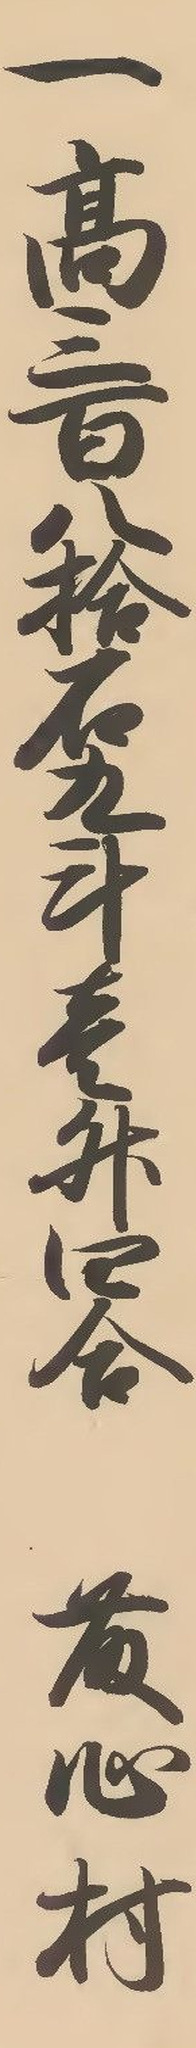一高三百八拾石九斗壱升四合藤心村
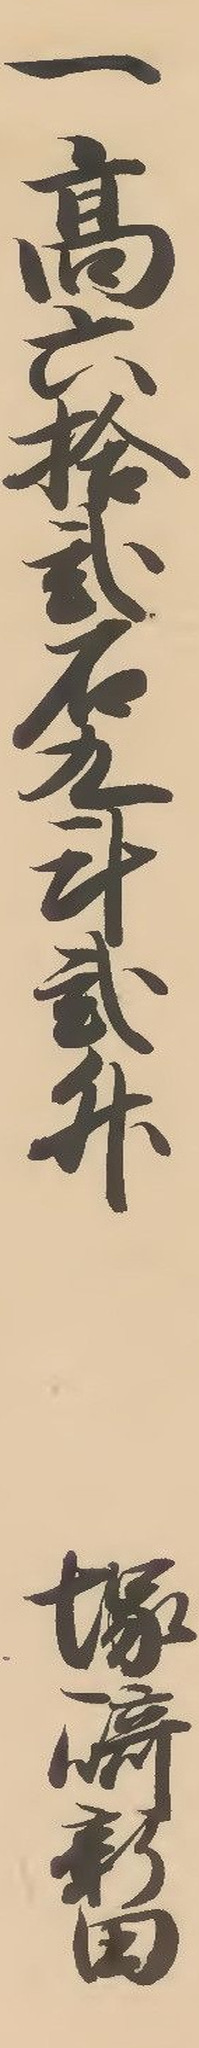一高六拾弐石九斗弐升塚崎新田
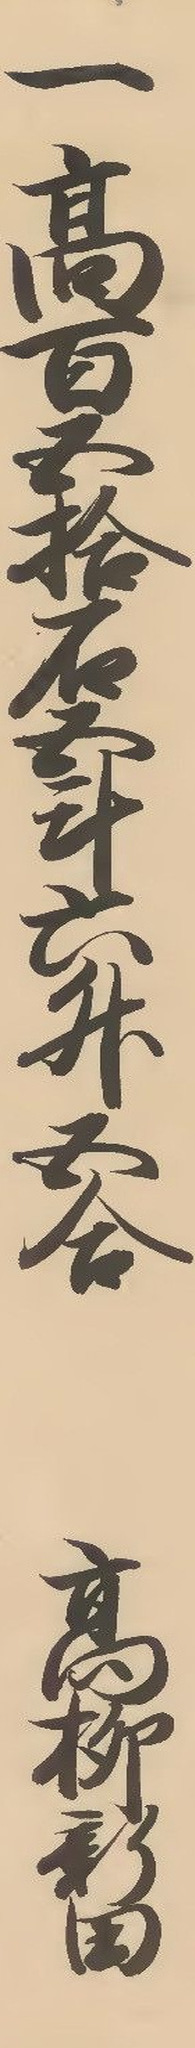一高百五拾石五斗六升五合高柳新田
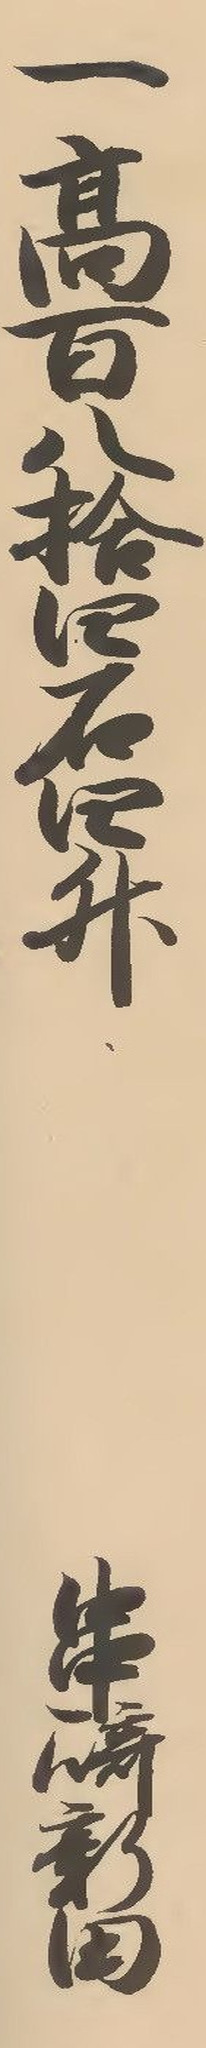一高百八拾四石四升串崎新田
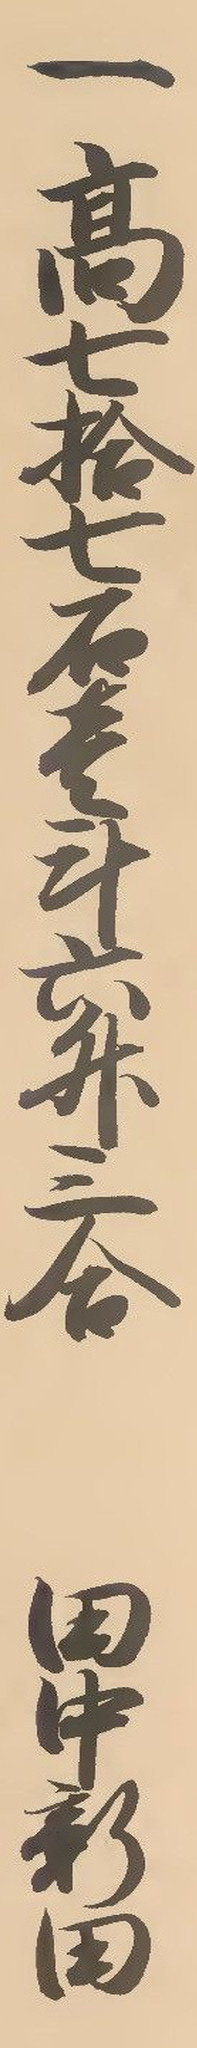一高七拾七石壱斗六升三合田中新田
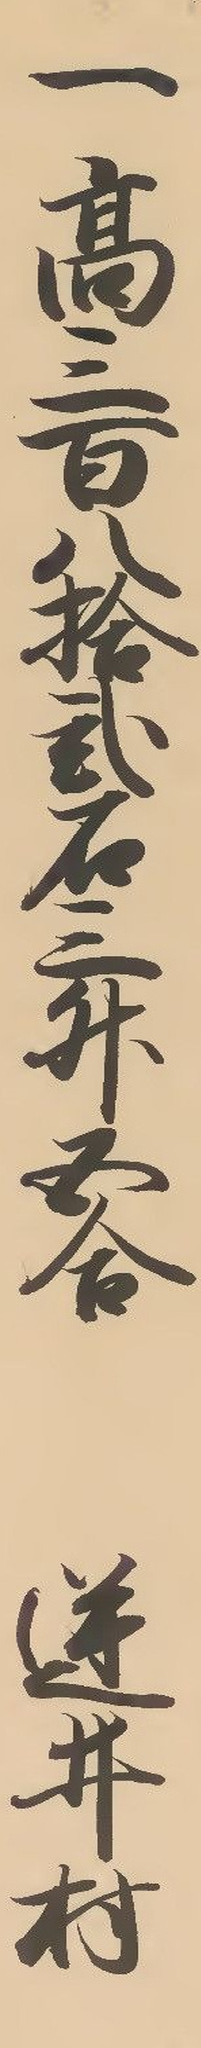一高三百八拾弐石三升五合逆井村
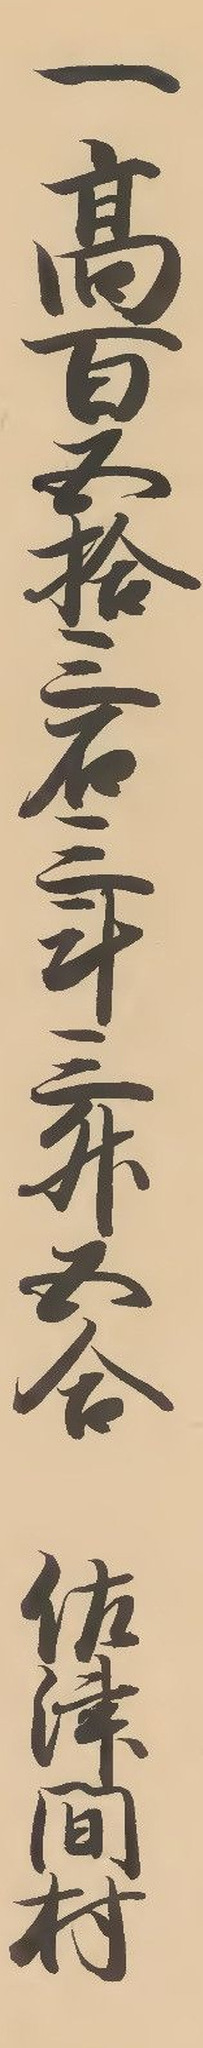一高百五拾三石三斗三升五合佐津間村
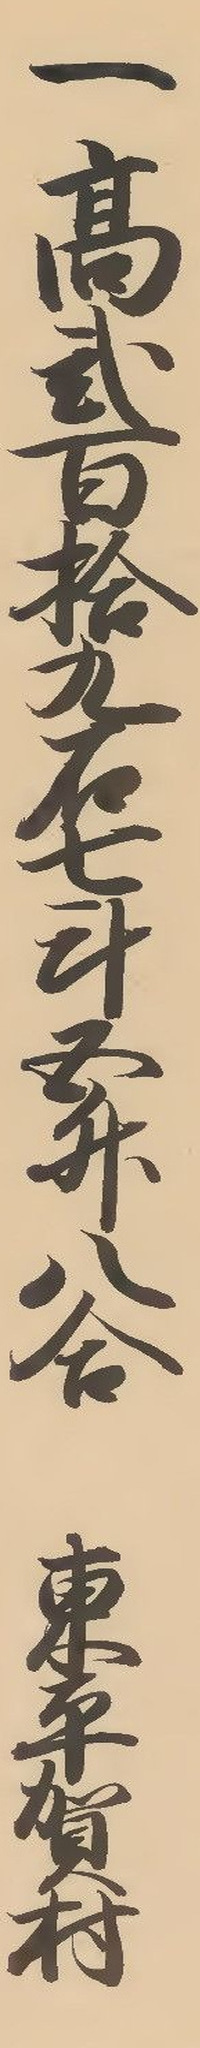一高弐百拾九石七斗五升八合東平賀村
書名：下総国郷帳
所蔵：国立公文書館 National Archives of Japan
